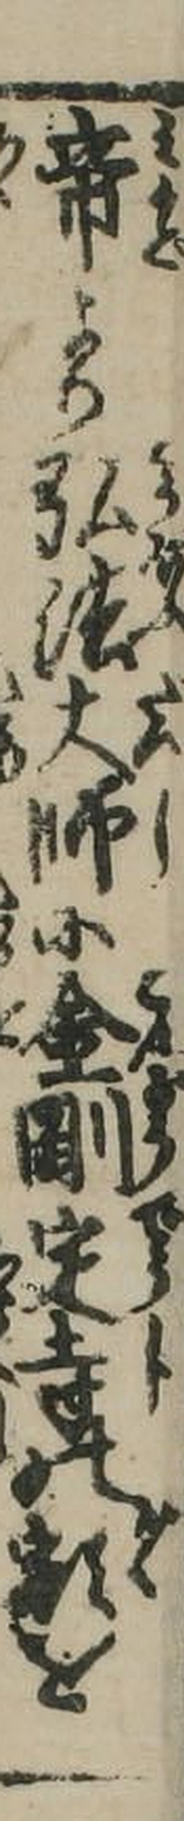帝より弘法大師に金剛定寺の額を
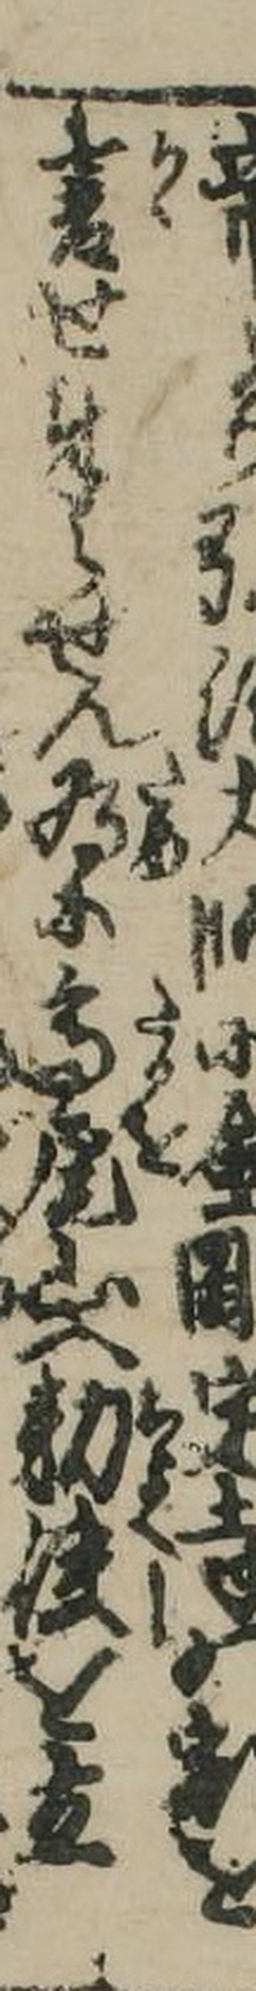書せ、奉らせん為に高尾山へ勅使を立
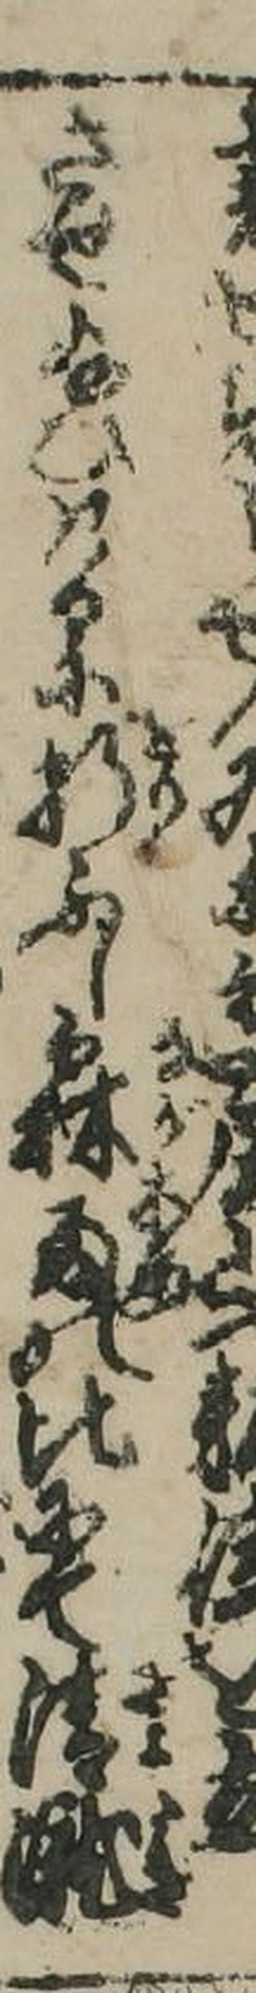させ給ひけるに折ふし霖雨のひにて清滝
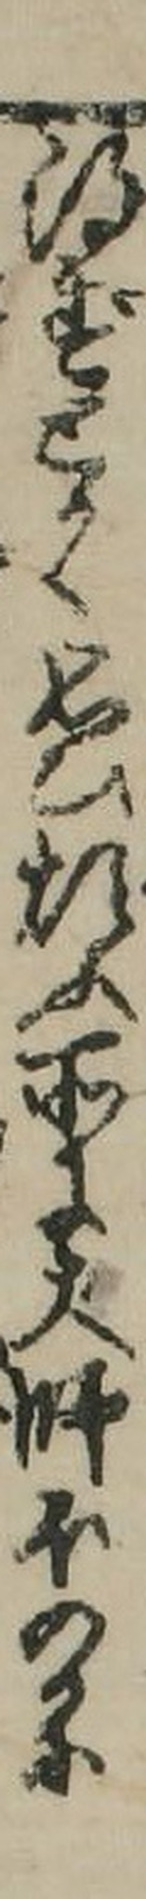得ずとかく思ひ煩ふ所に大師ほのかに
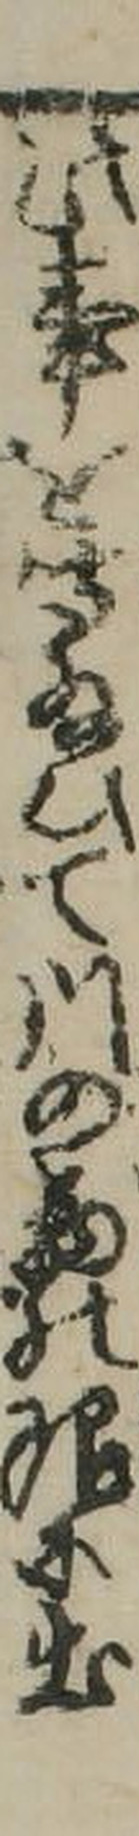此事を聞給ひて川の西の脇に出
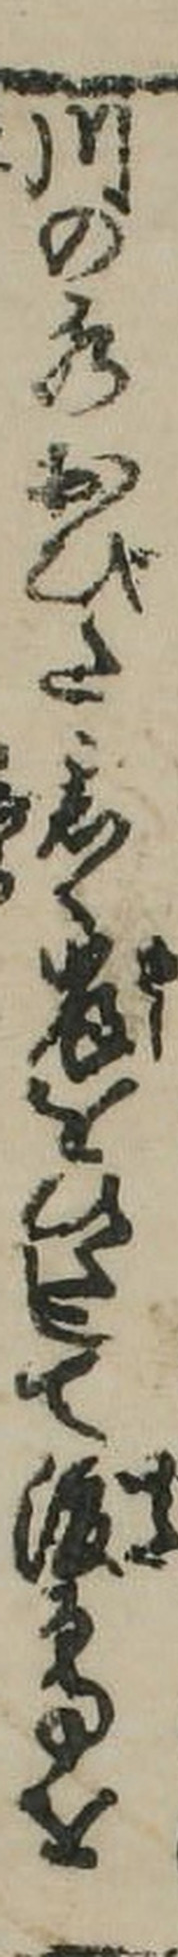川の水おびたゝしく岸をひたして渡る事を
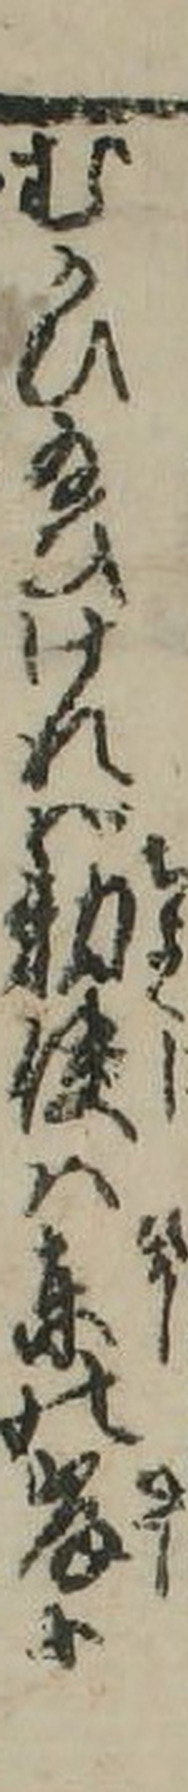むかひ給ひければ勅使は東の岸に
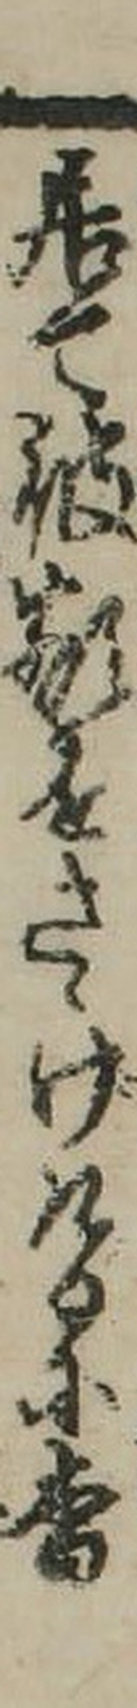居て彼額をさゝげけるに杳
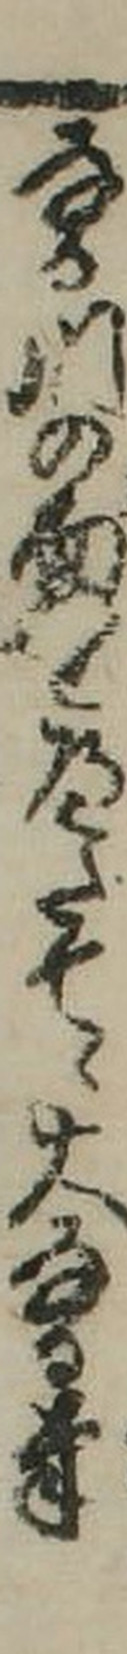なる川の面をへたてゝ大なる筆
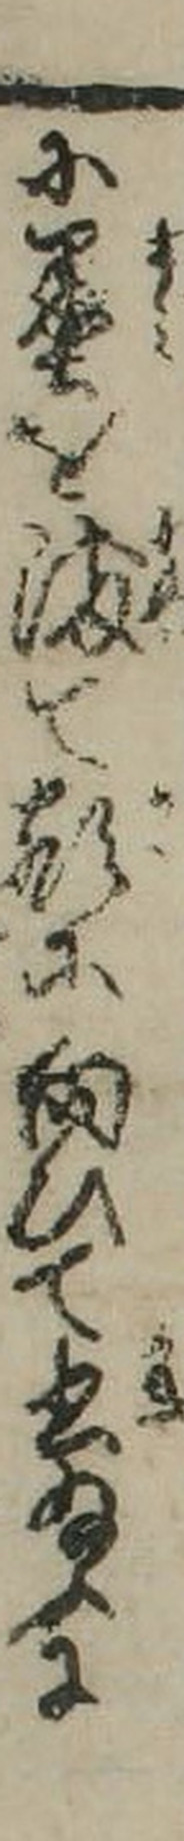に墨を満て額に向ひて書給ふに
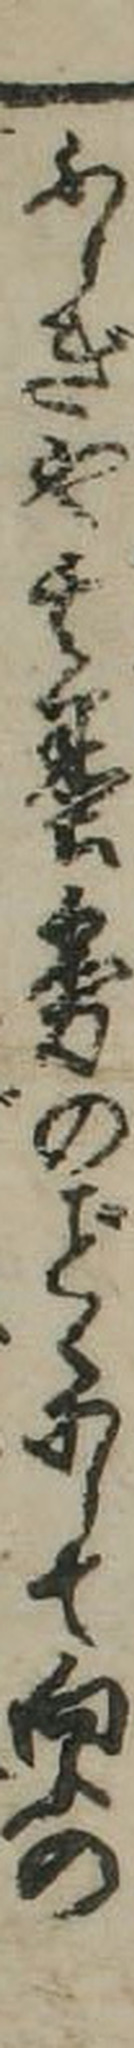ふしぎや其墨雰のごとくにして向ふの
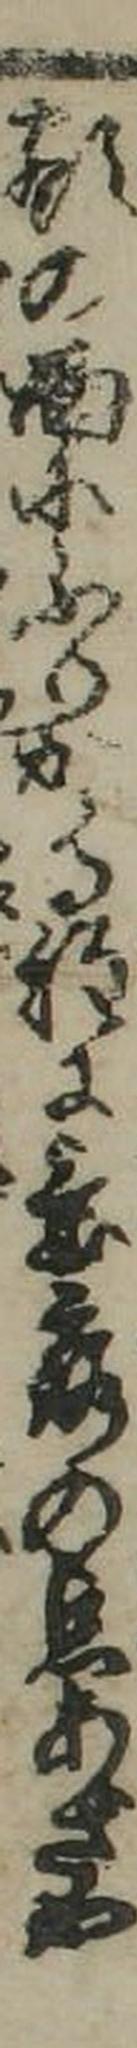額の面にふりかゝる程に垂露の点あざや
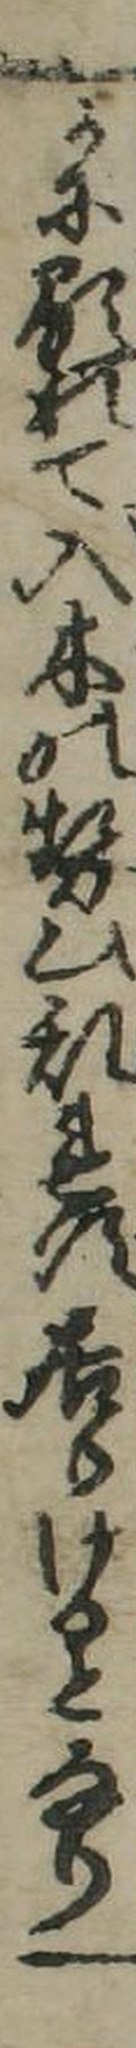かに顕れて入木の勢ひ乱れず居りけるとなり
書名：七字以呂波
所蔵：東京学芸大学教育コンテンツアーカイブ
